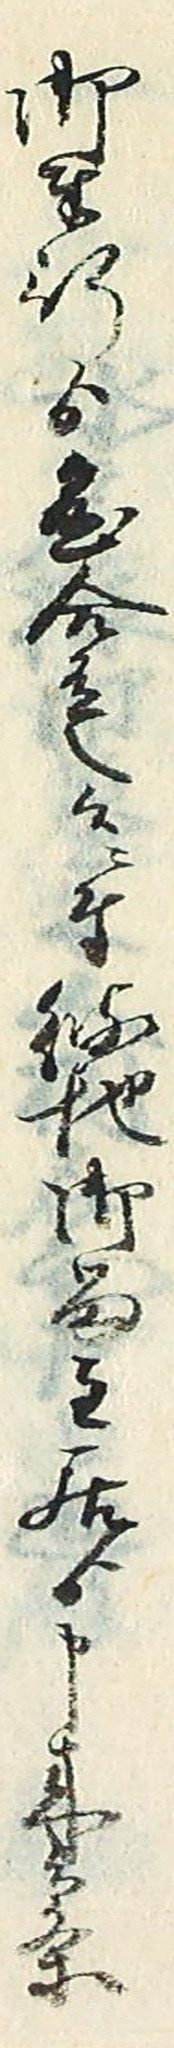御奉行ゟ懸合有之候ニ付彼地御留主居ゟ申来候条
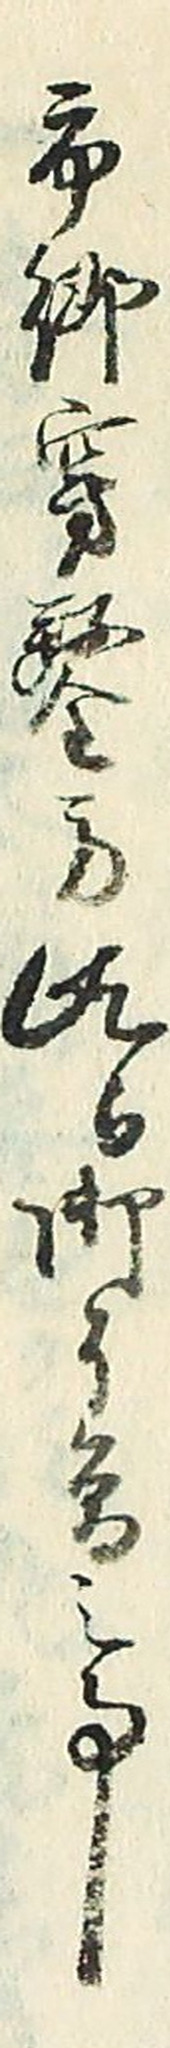市郷穿鑿方屹と御了簡之事
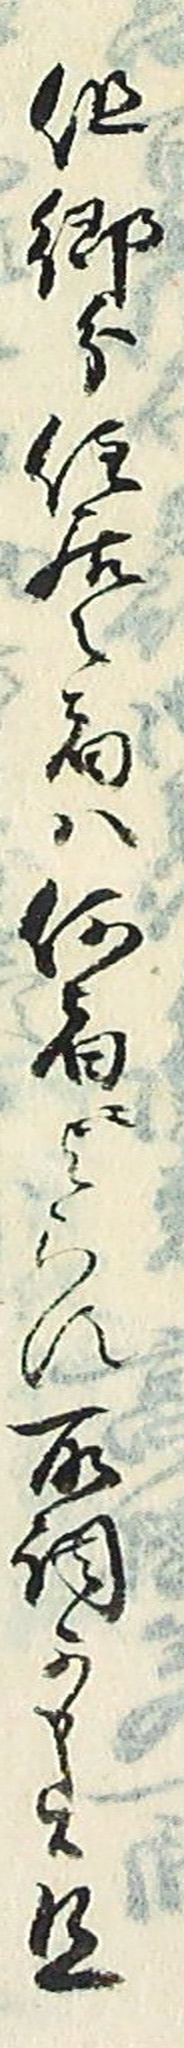但郷分住居之者ハ何者ニよらす取調可申候且
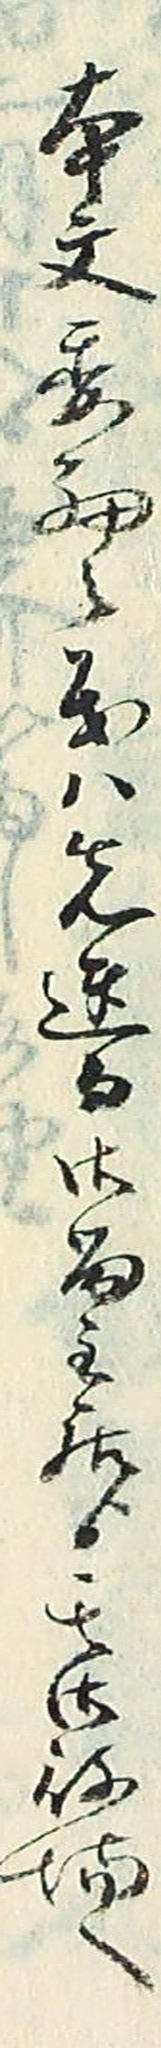本文委細之義ハ先達而御留主居ゟ其御役場へ
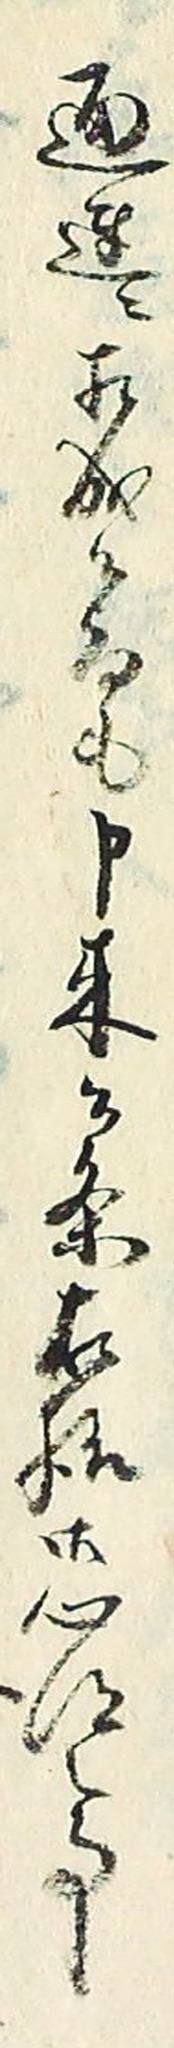通達ニ相成候旨も申来候条右様御心得之事
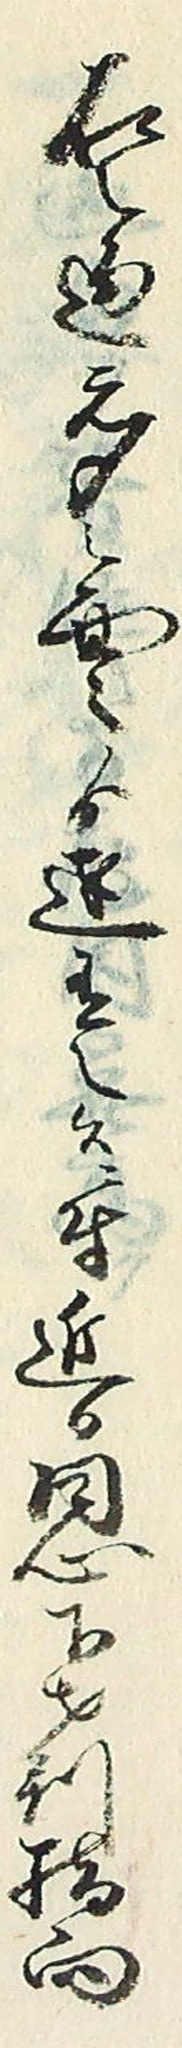右之通元〆之面々ゟ達有之候ニ付近日同心下才判指向
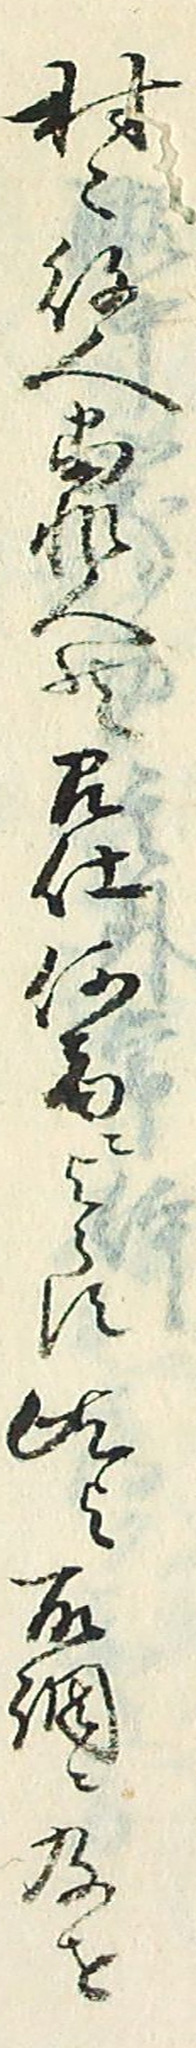村々役人番非人共召仕何者ニよらす屹と取調ニ及せ
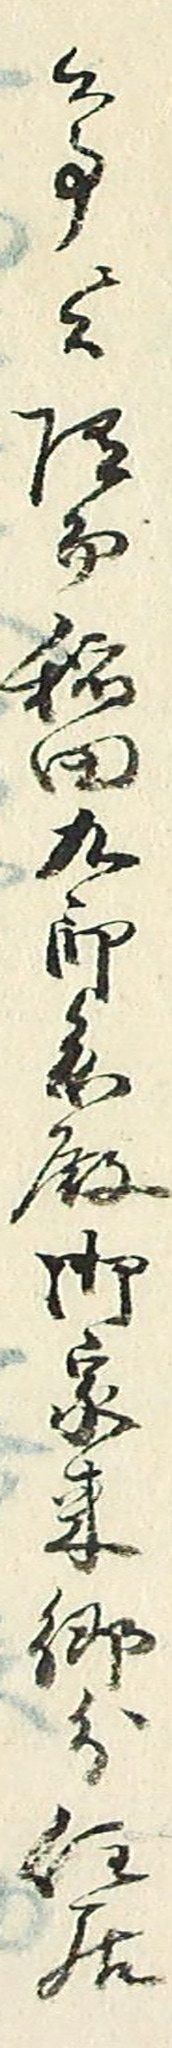候事ニ候随而稲田九郎兵衛殿御家来郷分住居
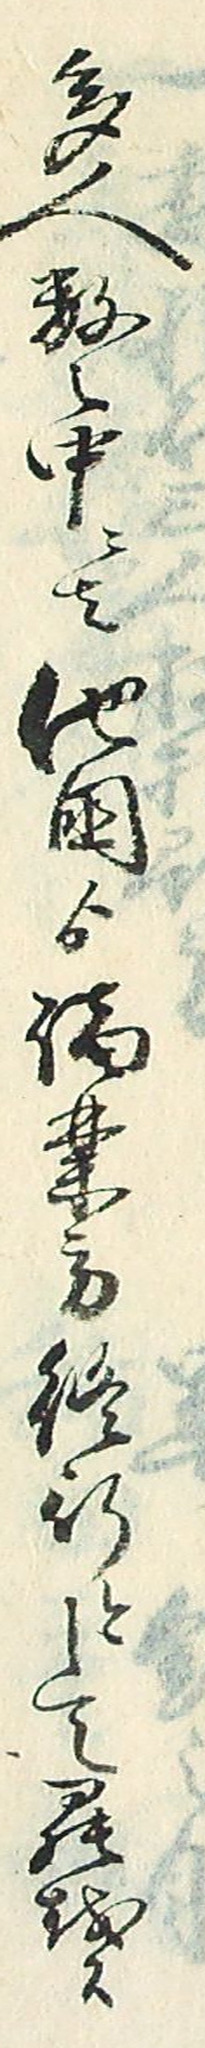多人数之中ニ者他国ゟ諸業方修行として罷越候
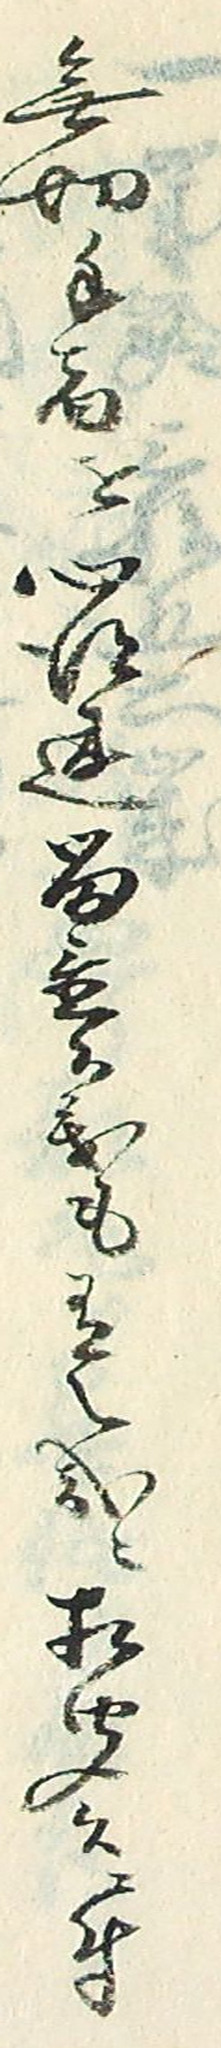無切手者を心得違留置候義も有之哉ニ相聞候ニ付
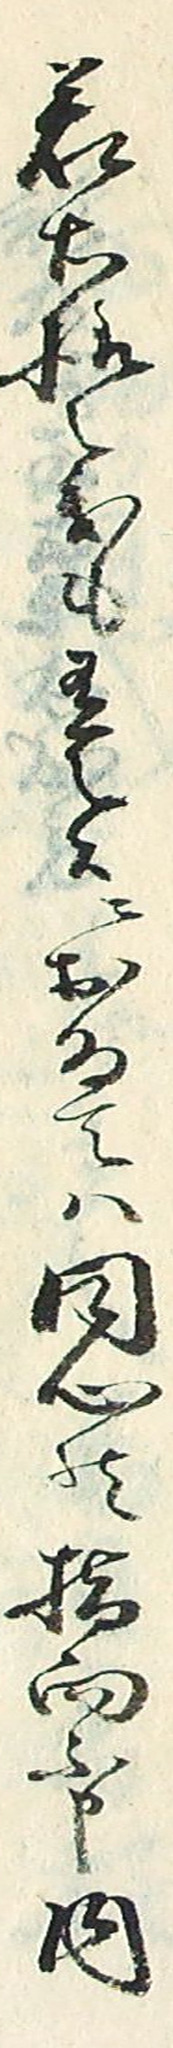若右様之義も有之候ニおゐてハ同心共指向不申内
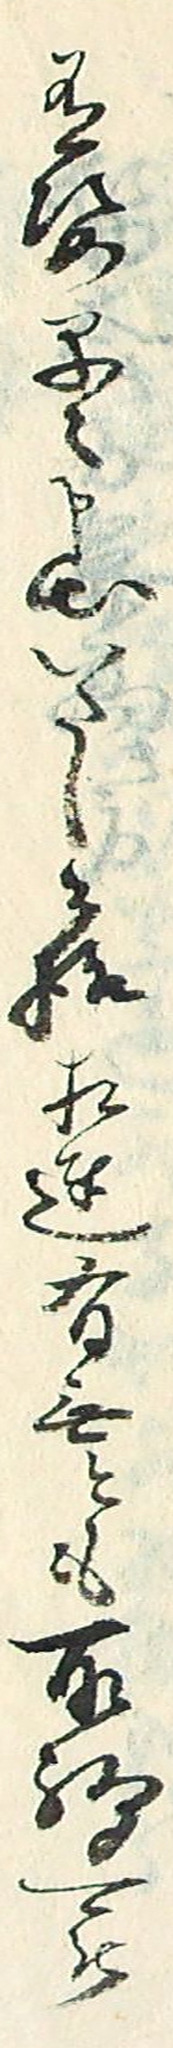有姿早々申出いたし候様相達有無とも取約メ可被

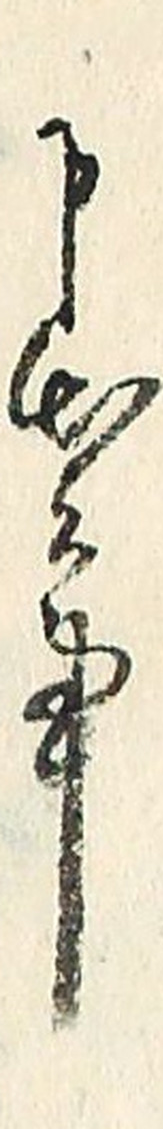申出候事
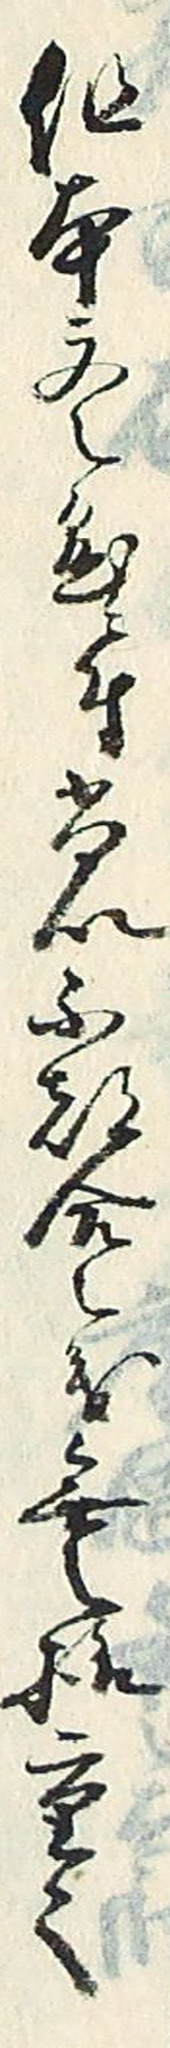但本文之懸ニ付尚以不都合之義無之様重々
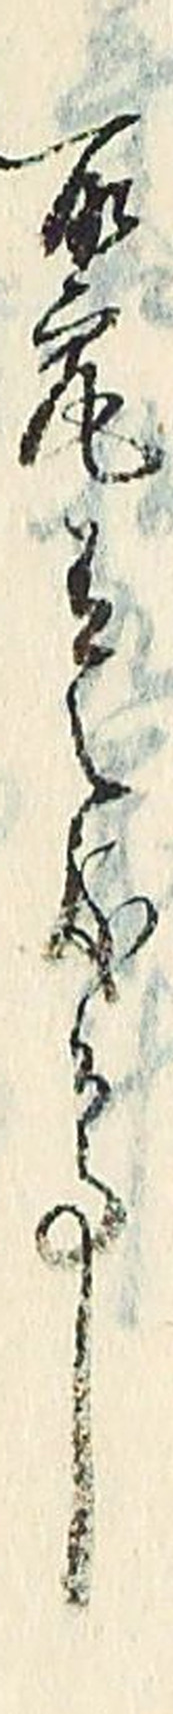取究有之度候事
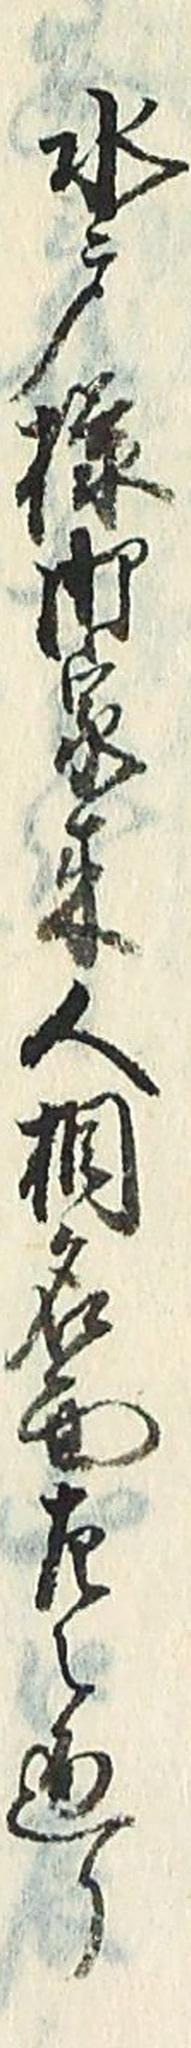水戸様御家来人相名面左之通り
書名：諸御趣意書并御下知向之写
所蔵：鳴門教育大学 Naruto University of Education
